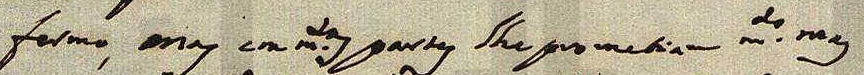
fermo, mas em m.tas partes lhe prometiam m.to mas
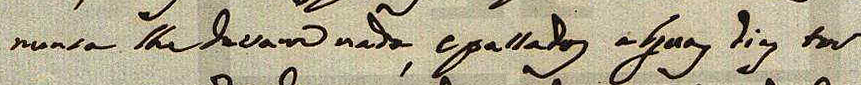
nunca lhe davam nada, e passados alguas dias tor
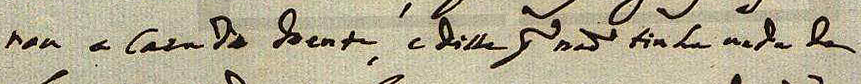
nou a Caza do doente e disse q̄ naõ tinha nada de
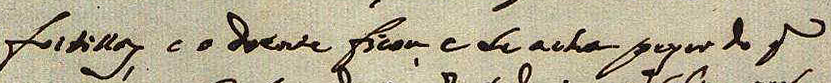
feiticos, e o doente ficou, e se achou peyor do q̄
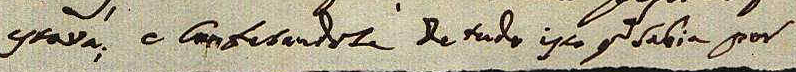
estava; e confesandoze de tudo isto q̄ sabia por
